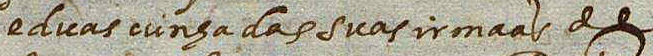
e duas cunhadas suas irmaãs de
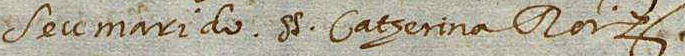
seu marido. ss. Catherina Roiz̄
